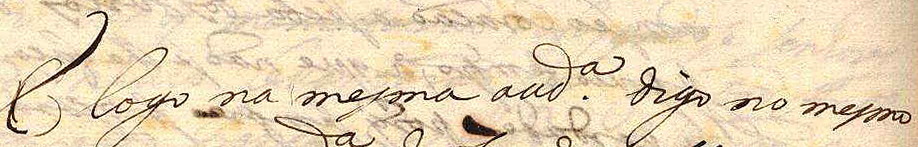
E logo na mesma aud.a digo no mesmo
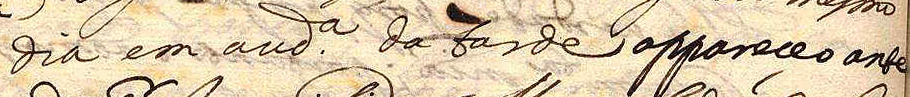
dia em aud.a da tarde appareceo ante
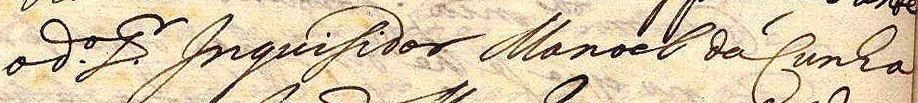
o d.o s.r Jnquisidor Manoel da Cunha
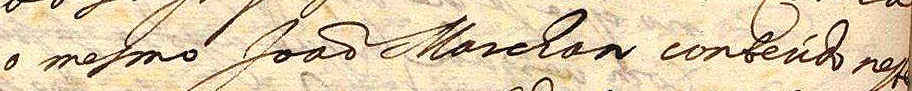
o mesmo Joaõ Marchan conteudo neste
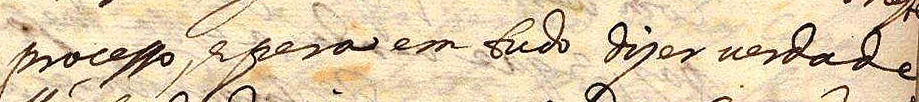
processo, E pera em tudo dizer uerdade
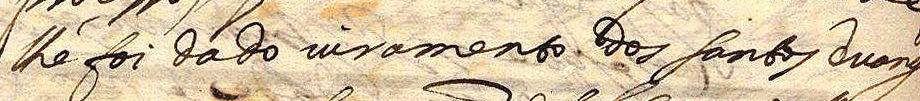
lhe foi dado iuramento dos santos euango
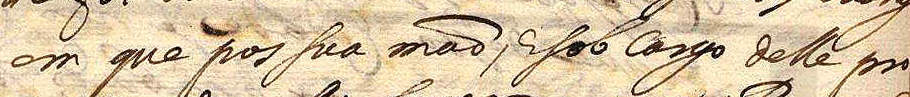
em que pos sua mão, E sob cargo delle pro
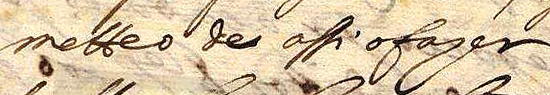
metteo de assi o fazer
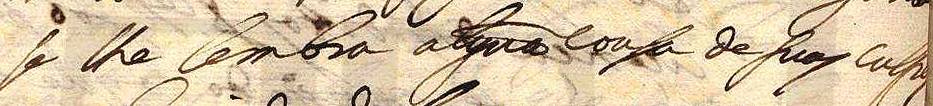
se lhe lembra algūa cousa de suas culpas
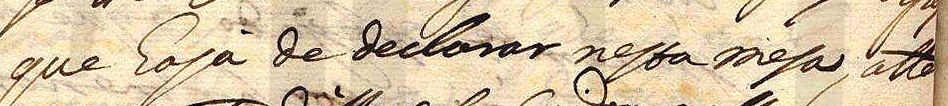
que haja de declarar nesta mesa allē
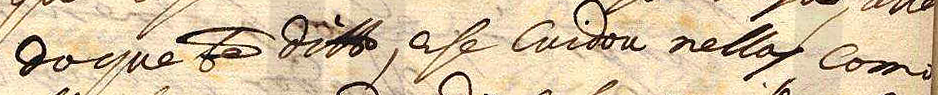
do que tē ditto, e se cuidou nellas como
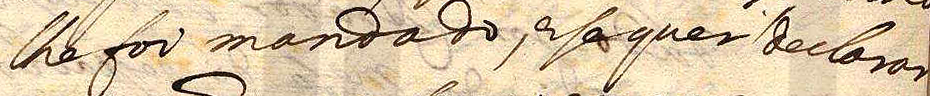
lhe foi mandado, E se quer declarar
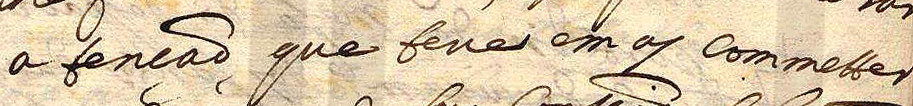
a tençaõ que teue em as commetter
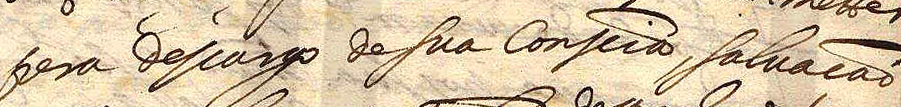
pera descargo de sua conscīa, saluaçaõ
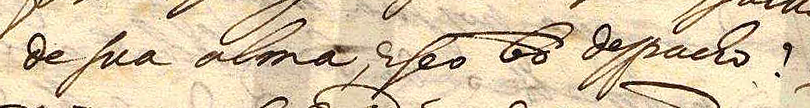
de sua alma, E seo bō despacho?
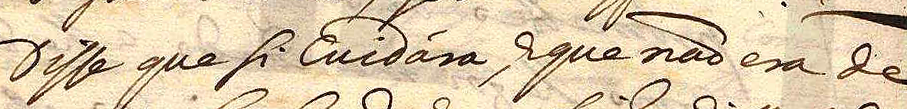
Disse que si cuidara, E que não era de
